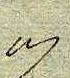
uj
